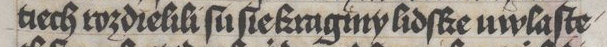tiech rozdielili ſu ſie kraginy lidſke u wlaſte¬
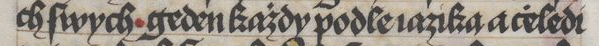ch ſwych.geden każdy podle iazika a ċeledi
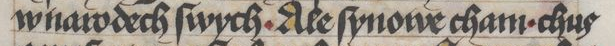w narodech ſwych.Ale ſynowe cham.chus
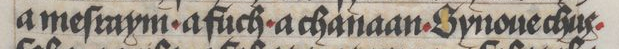a meſraym.a fuch.a chanaan.Synoue chus.
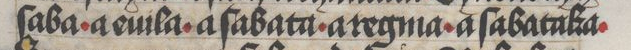ſaba.a euila.a ſabata.a regma.a ſabataka.
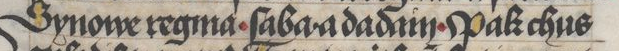Synowe regma.ſaba.a dalnin.Pak chus
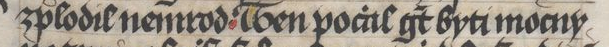zplodil nemrod.Wen poċal ḡt byti mocny
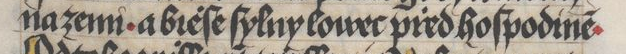na zemi.a bieẛe ſylny lowec pṙed hoſpodínē.
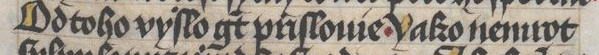Od toho vyẛlo ḡt pṙiſlouíe.Yako nemrot
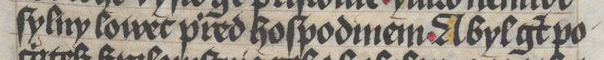ſylny lowec pṙed hoſpodinem.A byl ḡt po¬
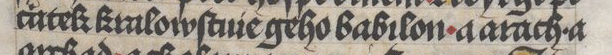ċatek kralowſtuie geho babilon.a arach.a
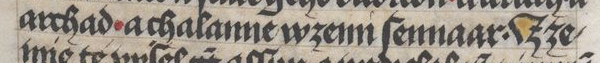archad.a chalamie wzemi ſemnaar.Z ze¬
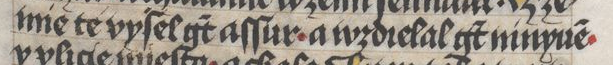mie te vyẛel ḡt aſſur.a wzdielal ḡt ninyuē.
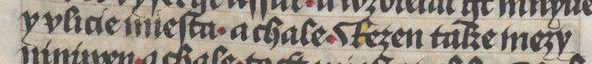y vlicie mieſta.a chale.Rezen take mezy
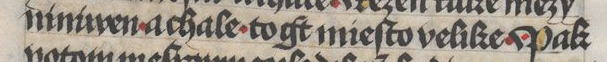niniwen.a chale.to ḡt míeſto velike.Pak
